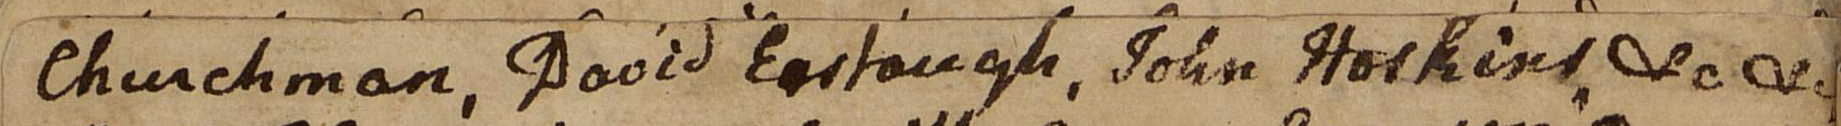Churchman, David Eastaugh, John Harkins &c &c
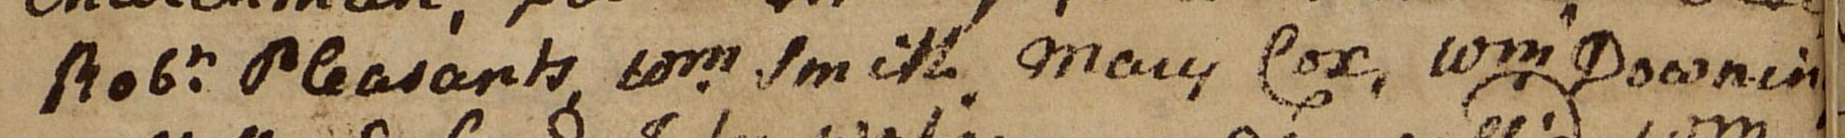Rob^t. Pleasants, W^m. Smith, Mary Cox, Wm Downin
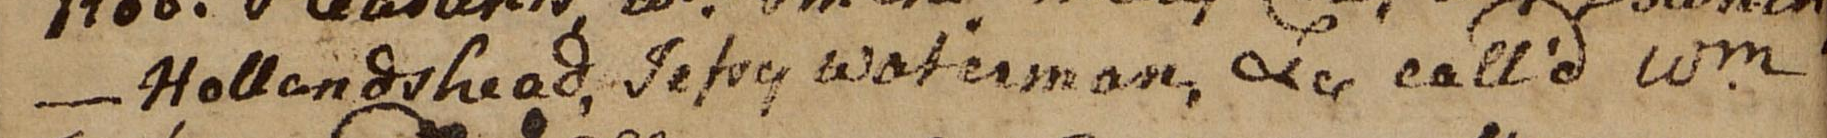- Hollandshead, Jessy Waterman, &c call'd W^m.
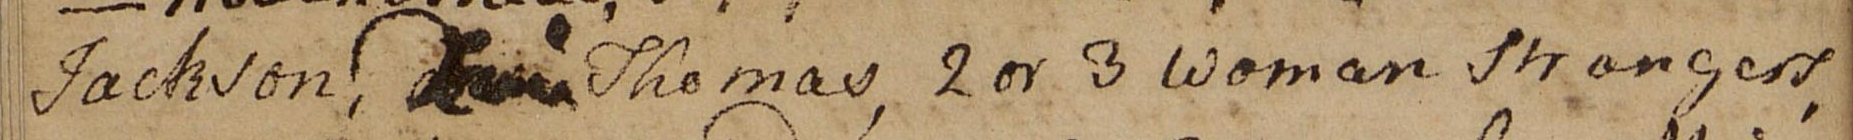Jackson, [Lewis] Thomas, 2 or 3 Woman Strangers,
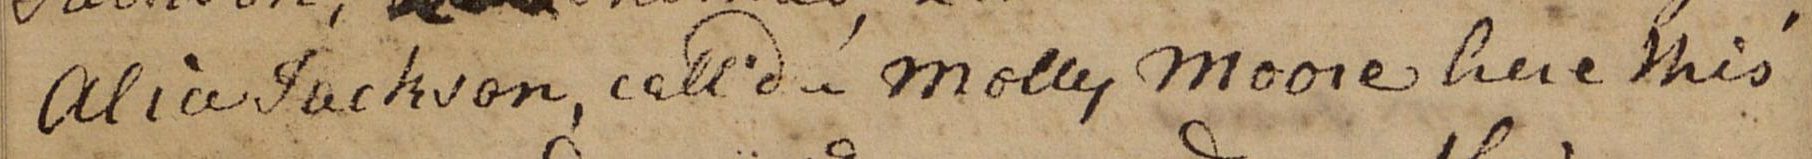Alice Jackson, call'd- Molly Moore here this
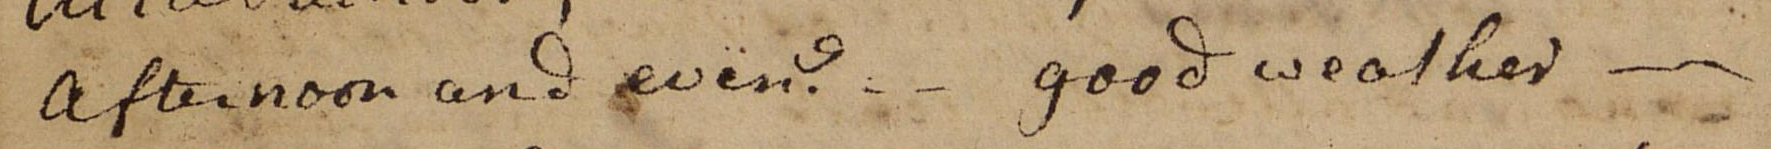Afternoon and even^g.- good weather-
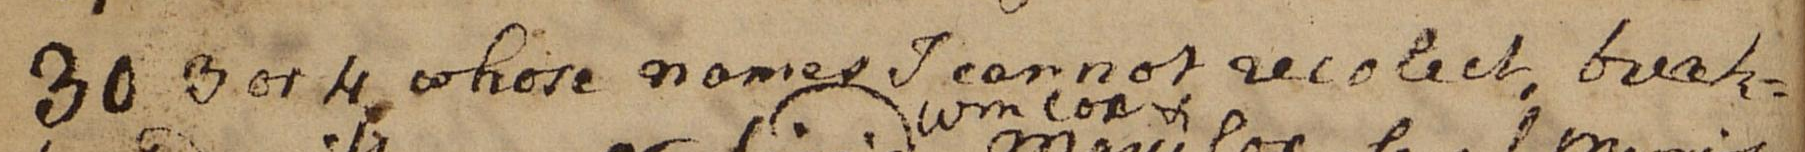30 3 or 4 whose names I cannot recolect, break-
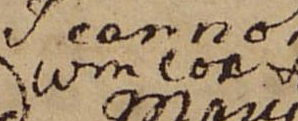W^m Cox &
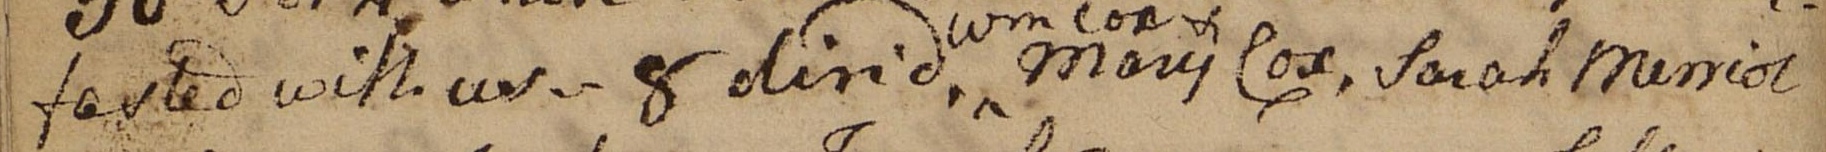fasted with us- 8 din'd, Mary Cox, Sarah Merrist
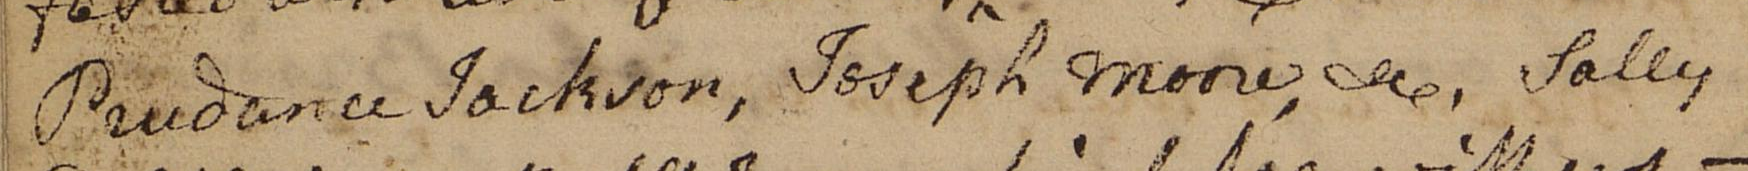Prudance Jackson, Joseph Moor, &c, Sally
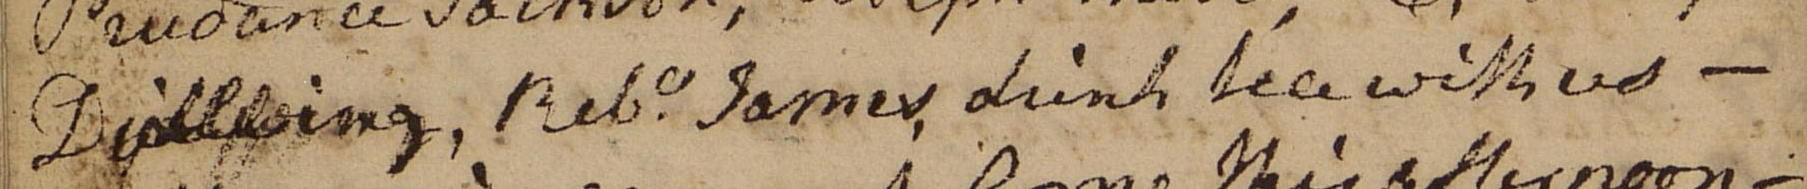D[iollwing], Reb^a. James, drink tea with us-
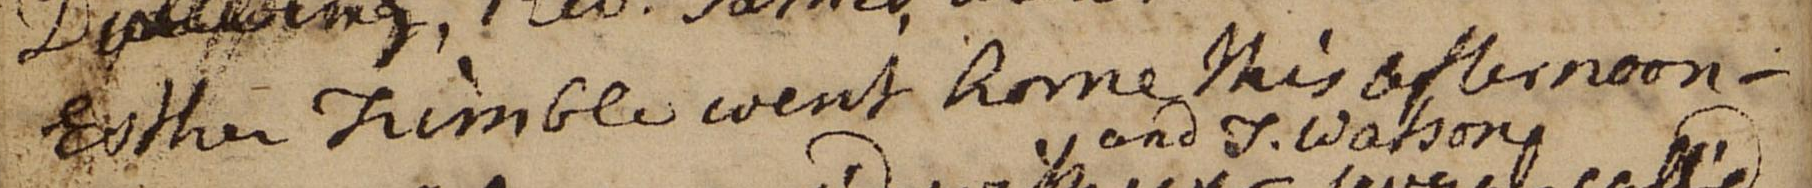Esther Trimble went home, this afternoon-
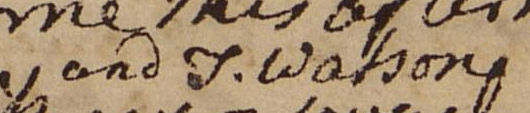and T. Watsong
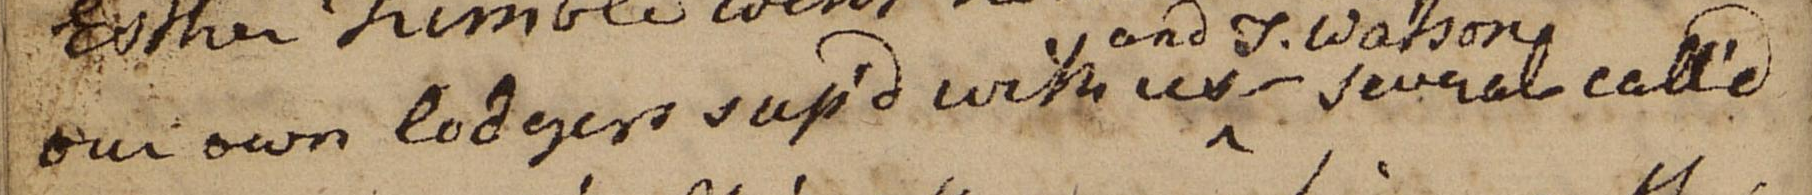our own lodgers sup'd with us- several call'd
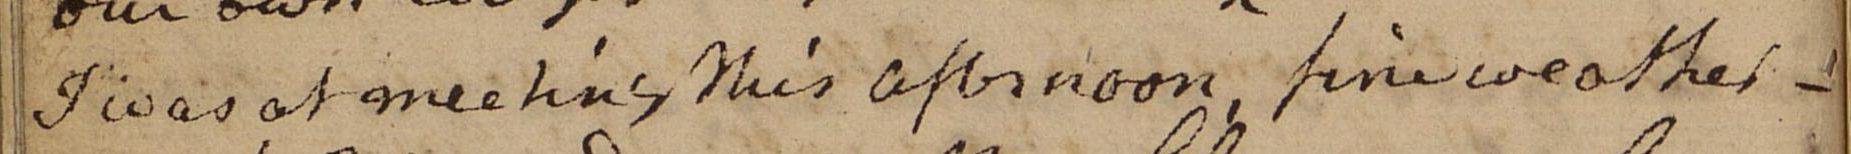I was at meeting this afternoon, fine weather-
